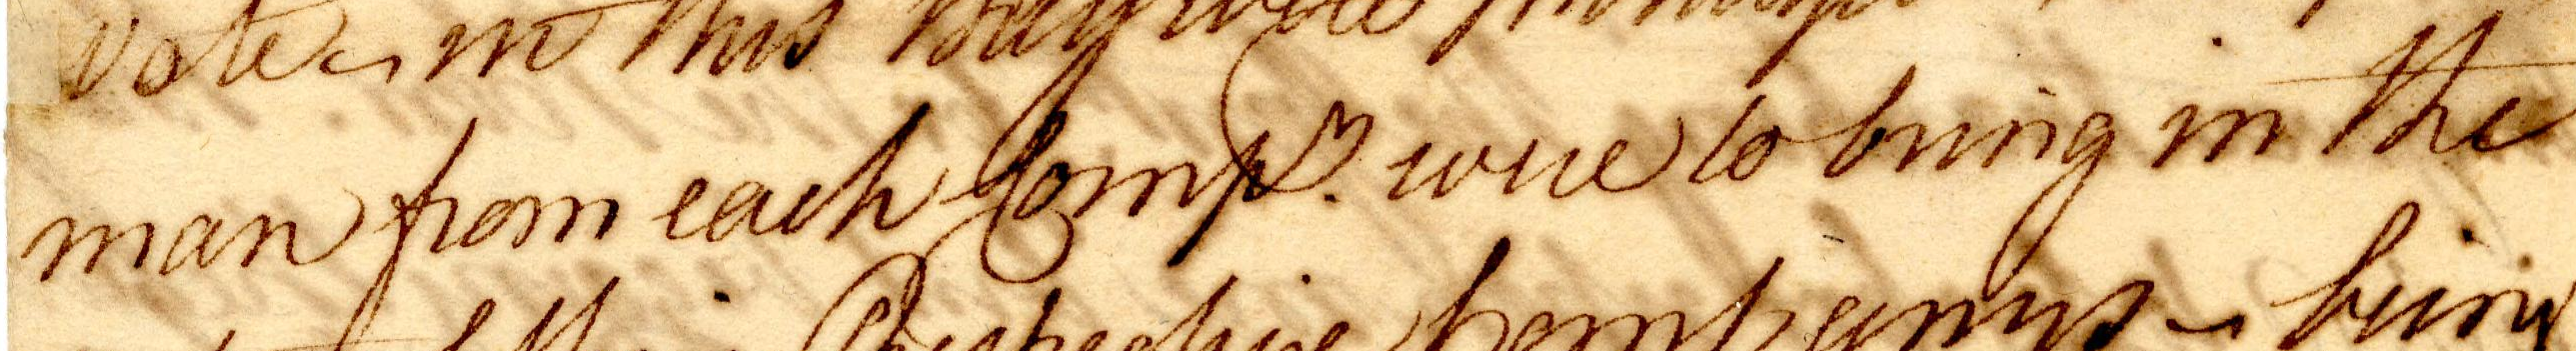man from each Comp^y. were to bring in the
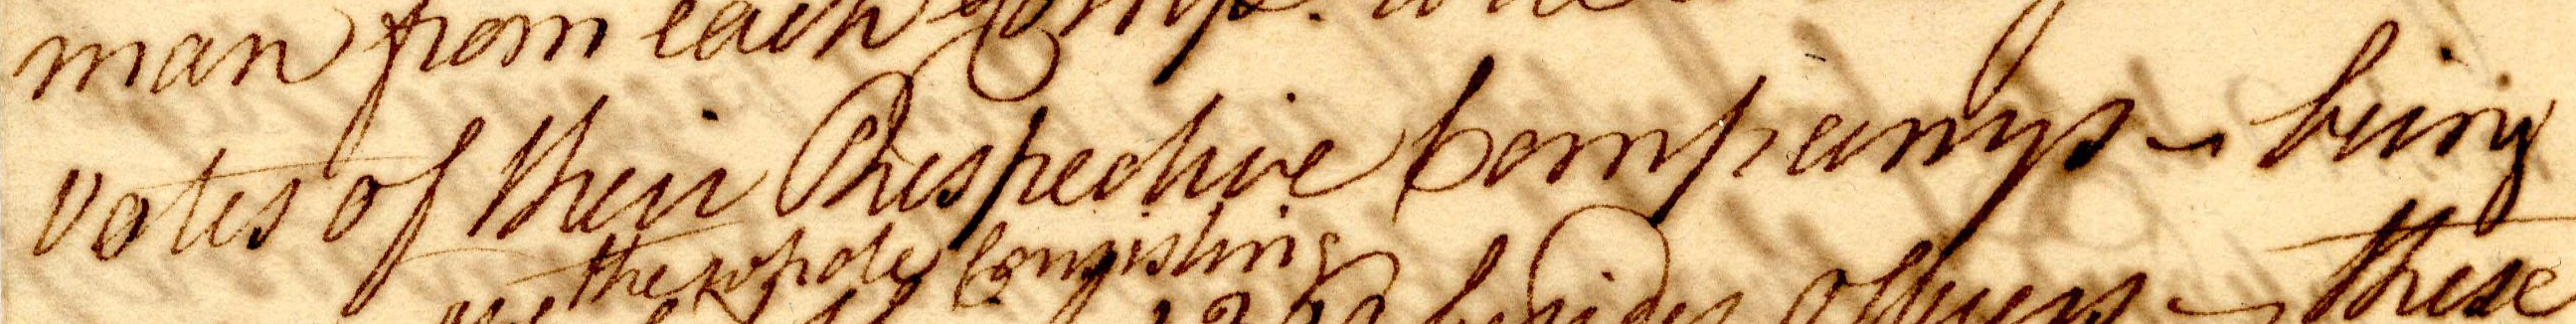votes of their Respective Companys, being
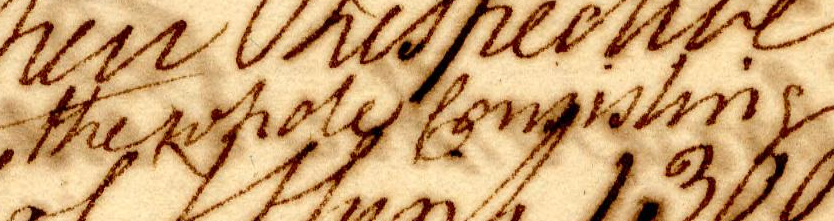the whole Consisting
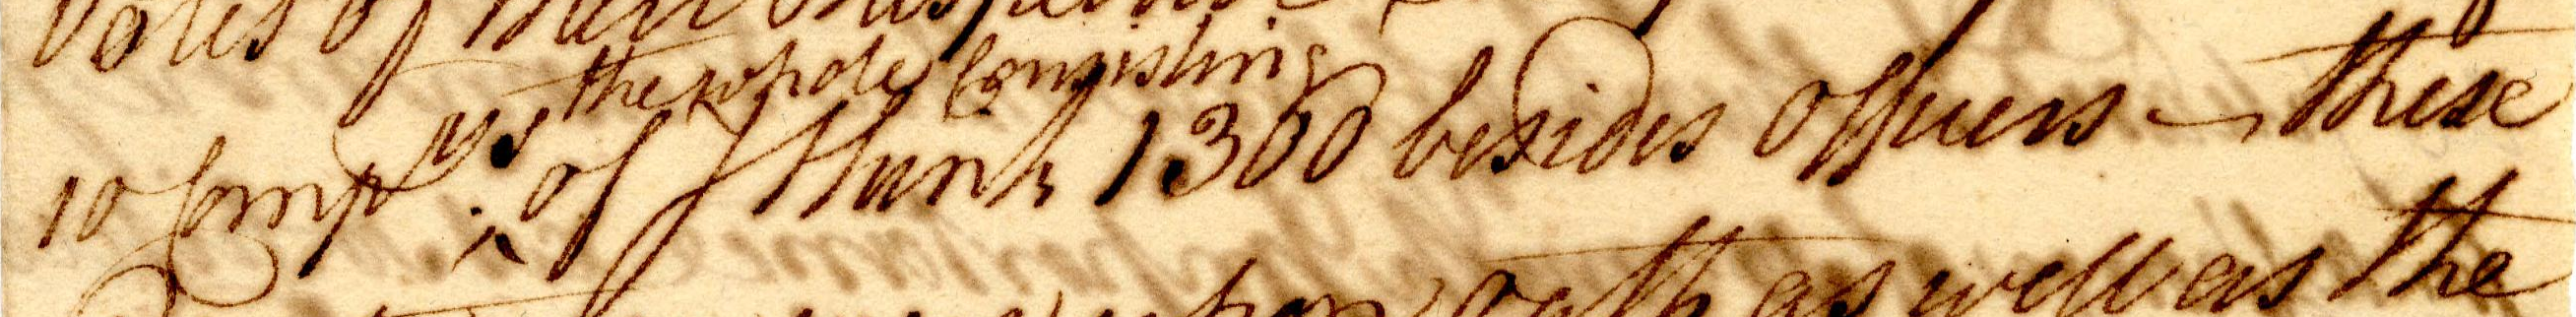10 Comp^y ^ of I think 1300 besides Officers. These
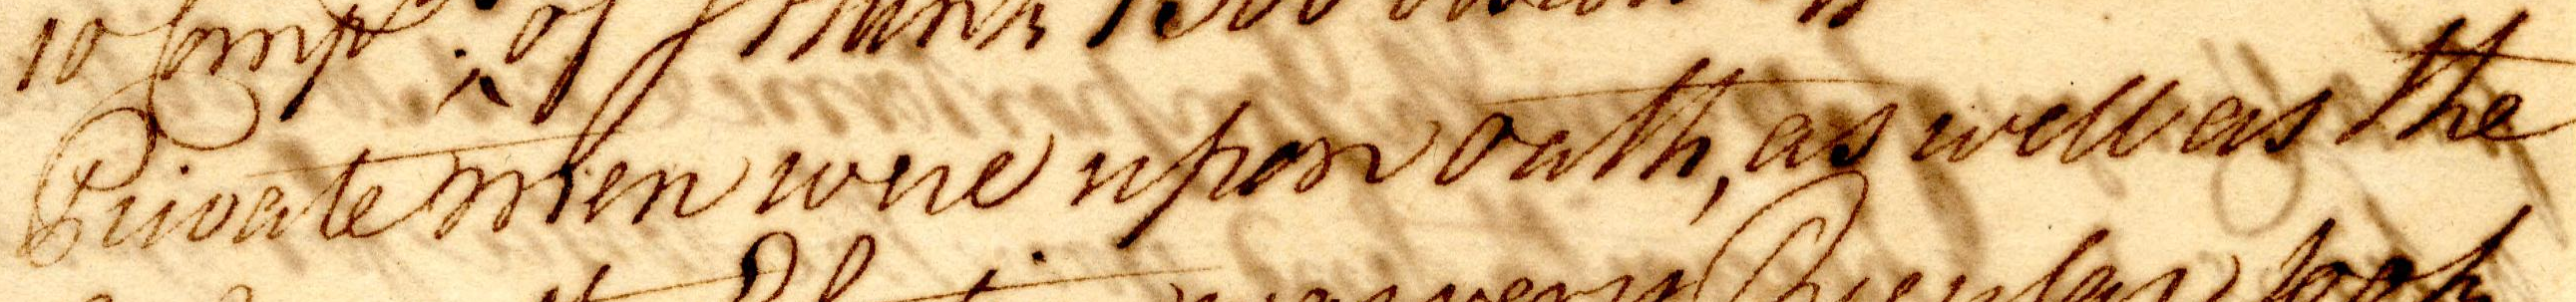Private men were upon oath, as well as the
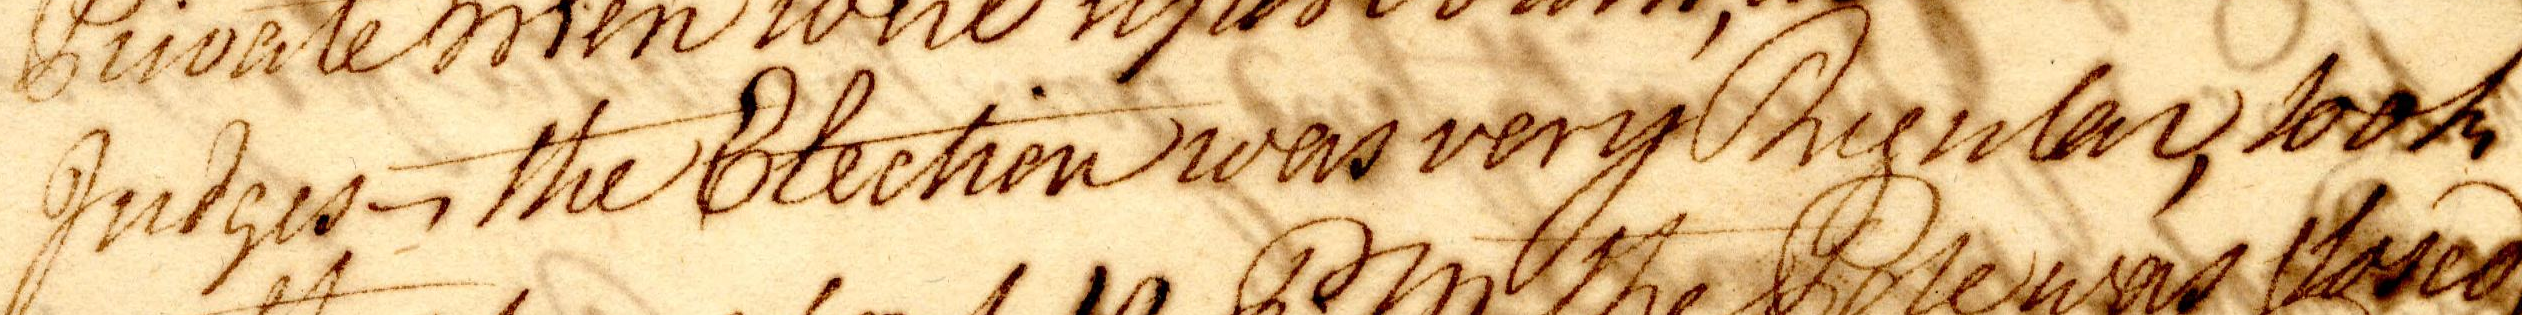Judges. the Election was very Regular, took
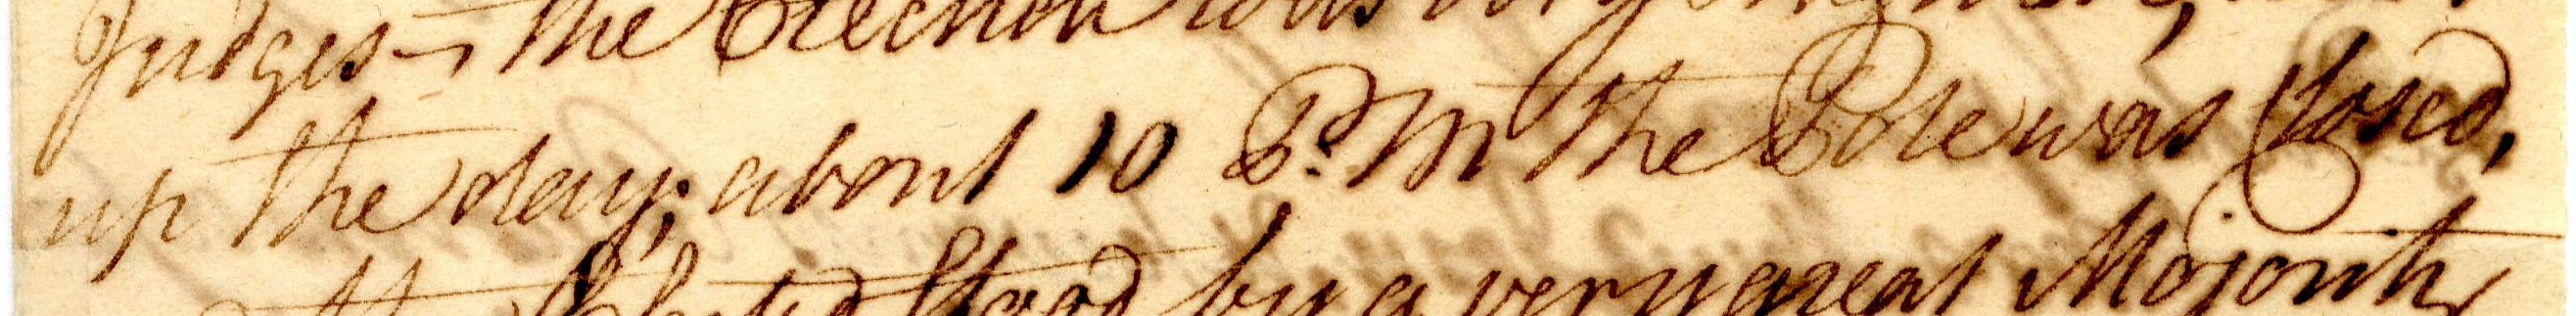up the day; about 10 P.M the Pole was Closed,
